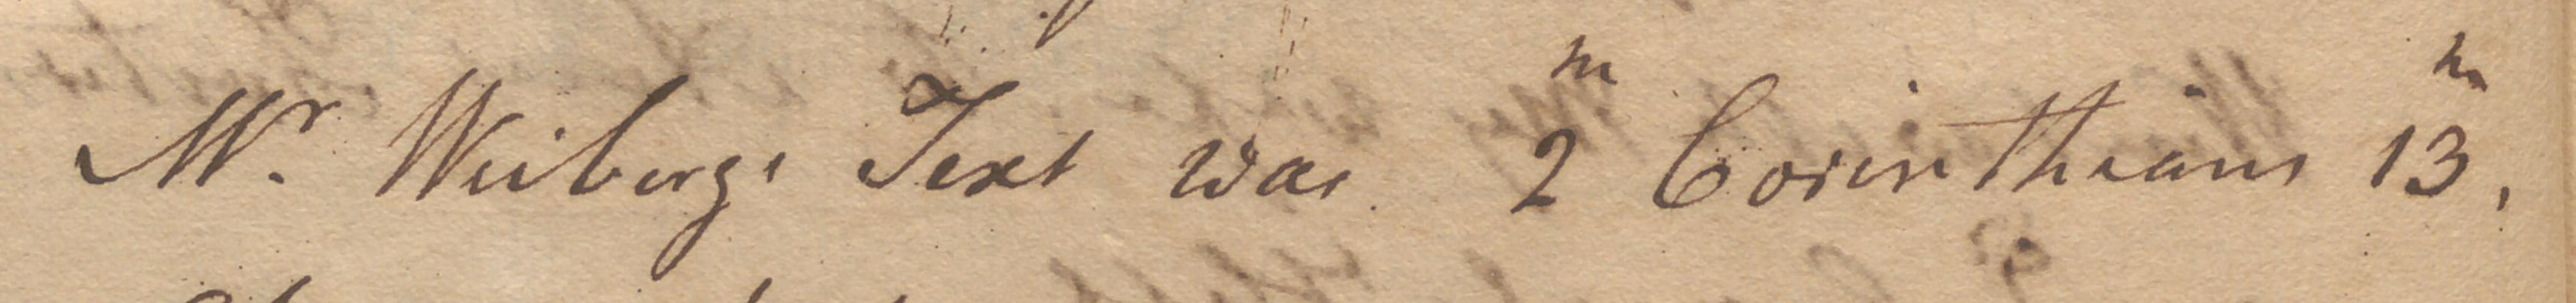M^r. Weibergs Text was 2^th Corinthians 13^th.
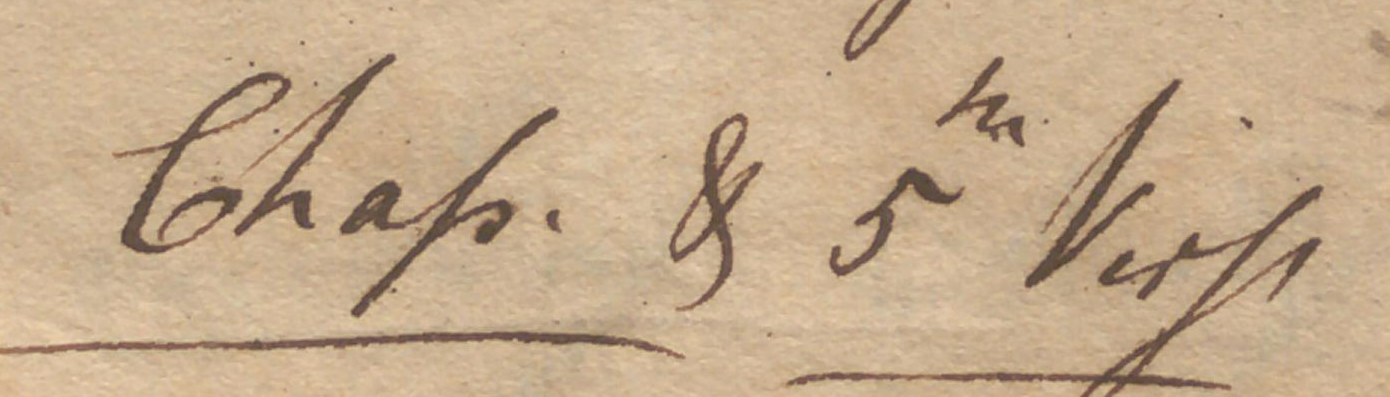Chap. & 5^th Verss
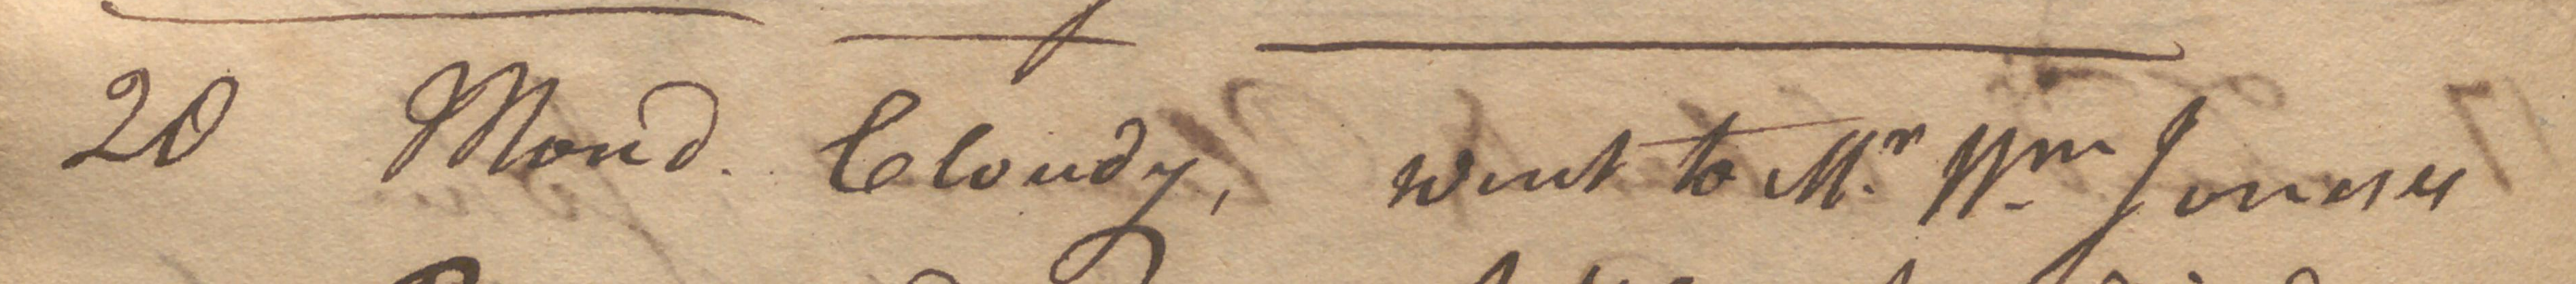20 Mond. Cloudy. went to M^r. W^m Joneses
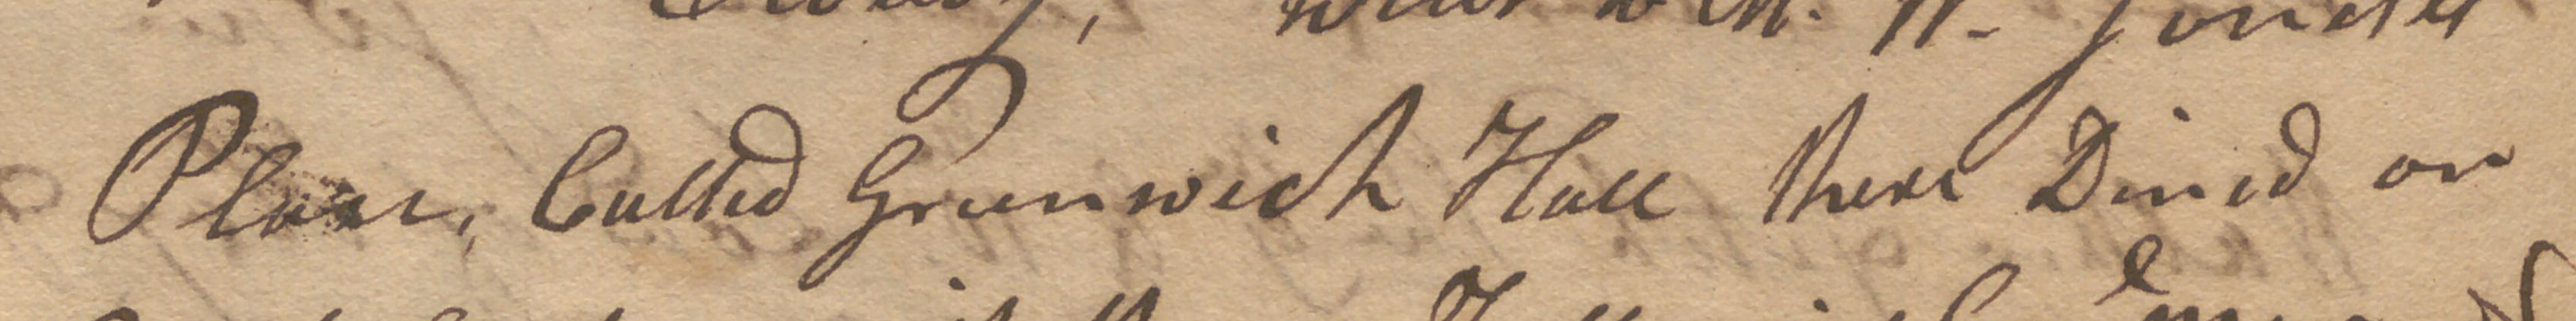Place, Culled Greenwich Hall there Dined on
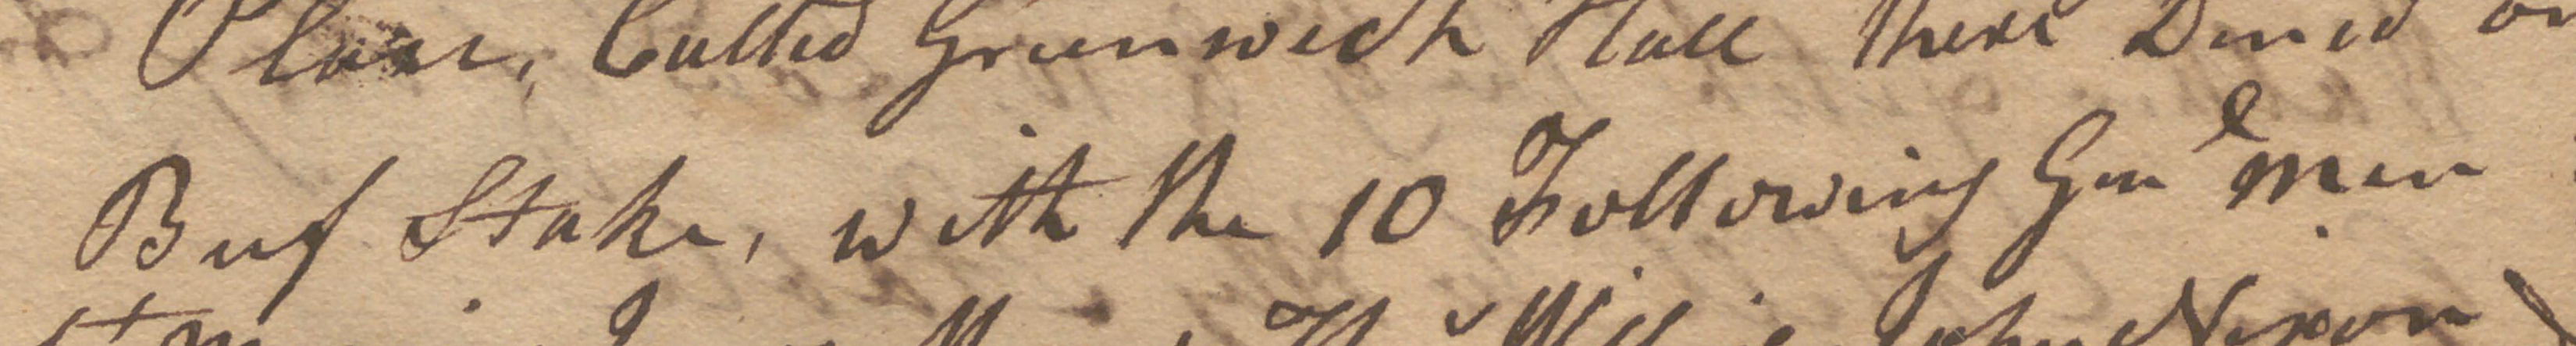Beef Stake, with the 10 Following Gen^l men
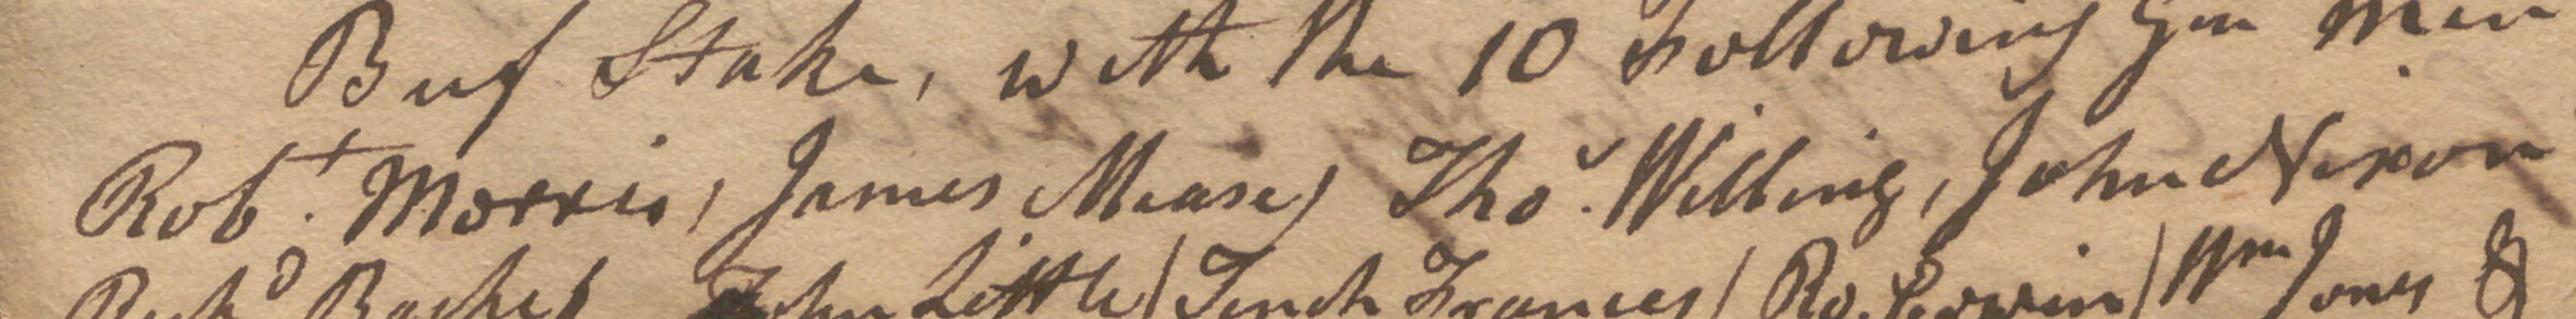Rob^t. Morris, James Mease Tho^s Willing, John Nixon
